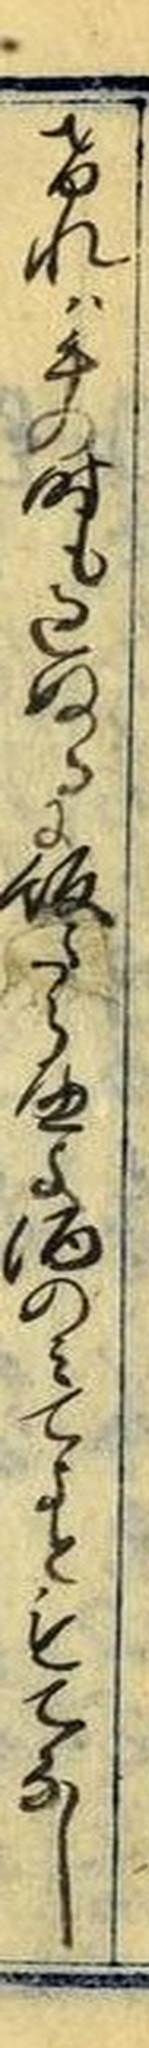けれは午の時も過ぬるに飯たうへよ酒のみてよともてなし
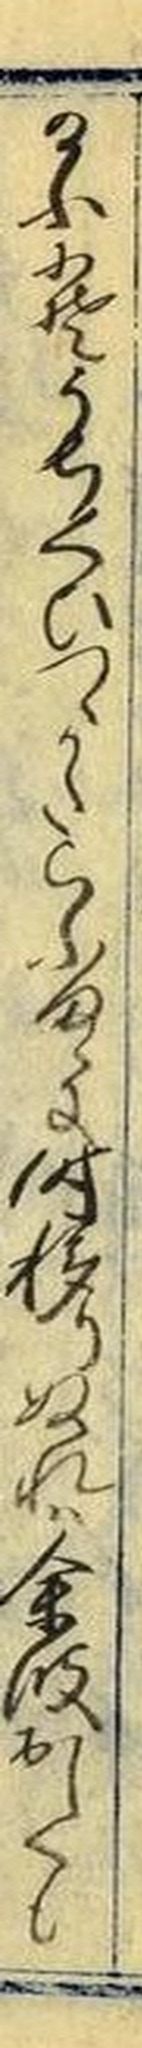給ふにそうちくひつゝかたらふまゝに時移りぬれは余波おしくも
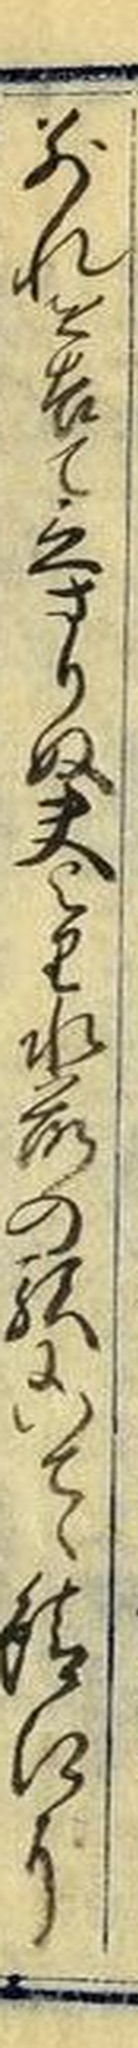別れを告て立さりぬ夫より水落の駅にいてゝ鯖江に
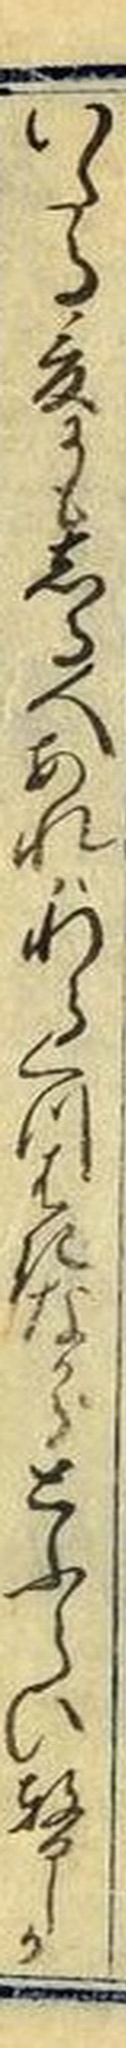いたる爰にもしる人あれはわらくつはきなからとふらひ暫しか
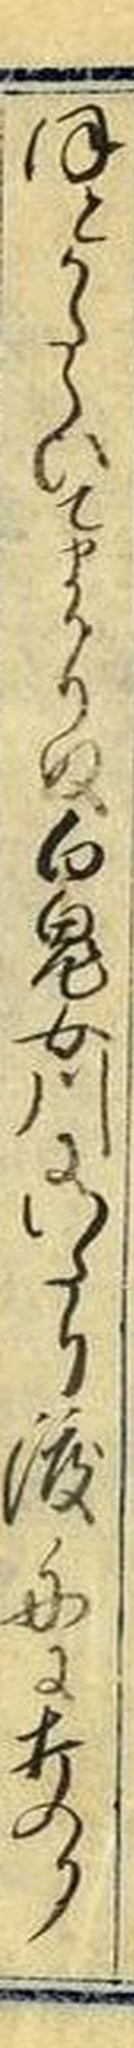ほとかたらひてまかりぬ白鬼女川にいたり渡舟に打のり
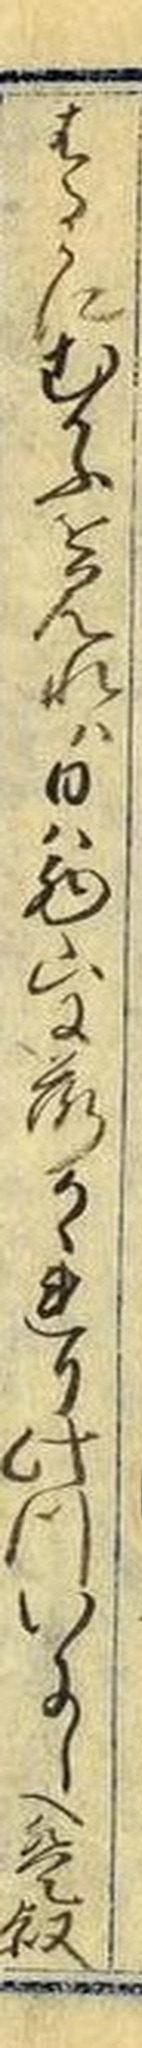はるかにむかふを見れは日は西山に落かゝれり此の川いにしへは叔
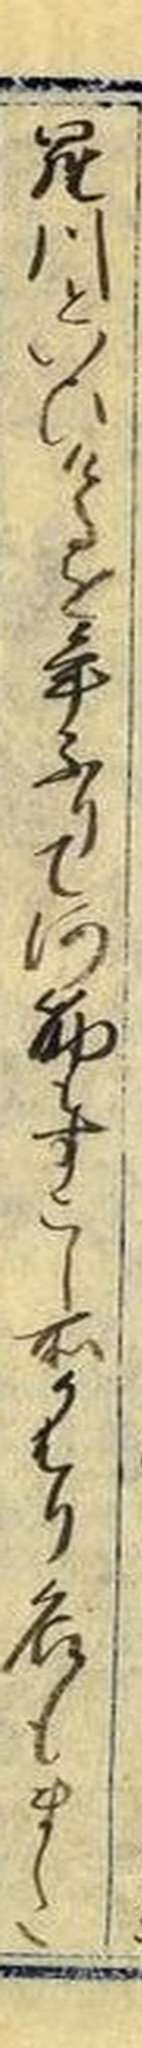羅川といひけるを年ふりて河筋すこし所かはり名もまた
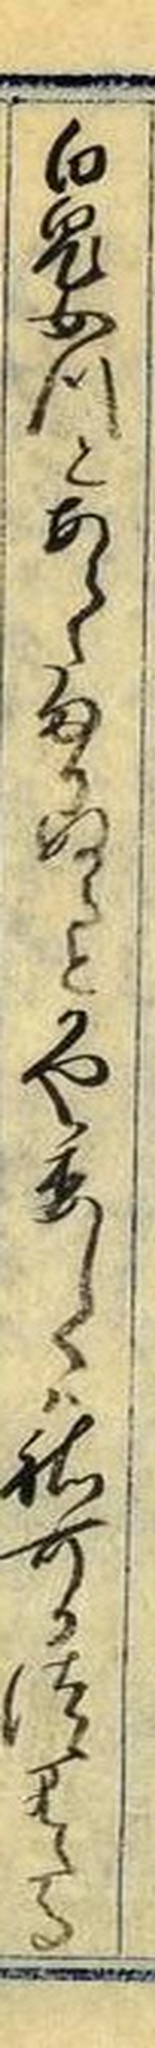白鬼女川とあらたまりぬとかや委しくは祐可かつゝりたる
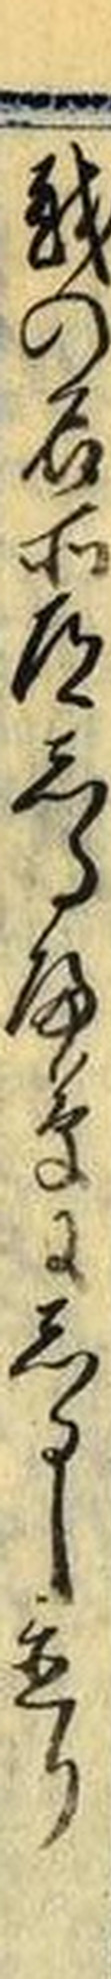越の名所道しるへ草にしるし置り

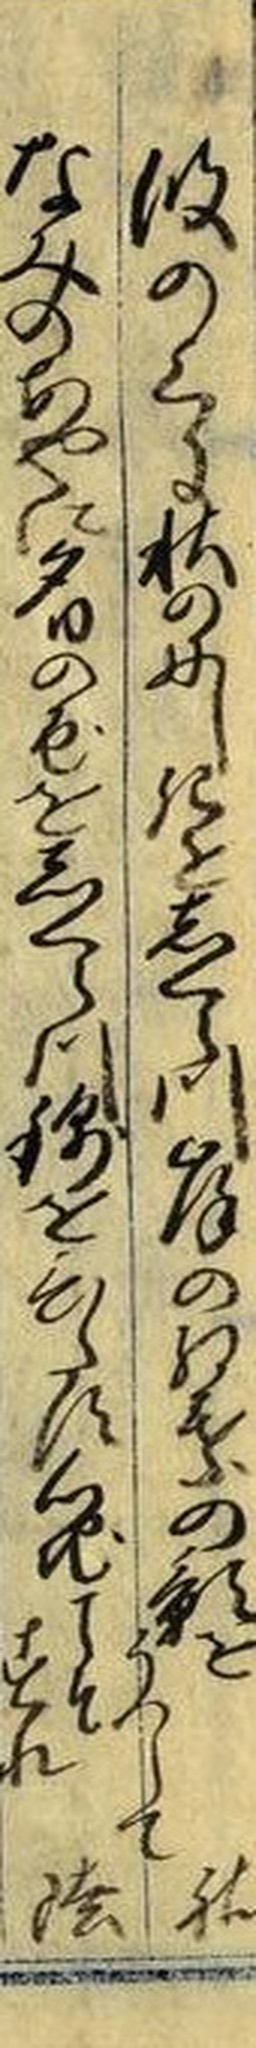なみのあやに夕日の色をしくら川錦をひたす心地こそすれ陸
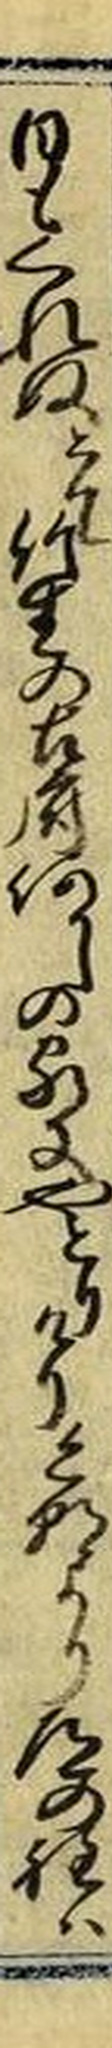日もくれぬとて竹生の古府何かしの家にやとりけり今朝より道の程は
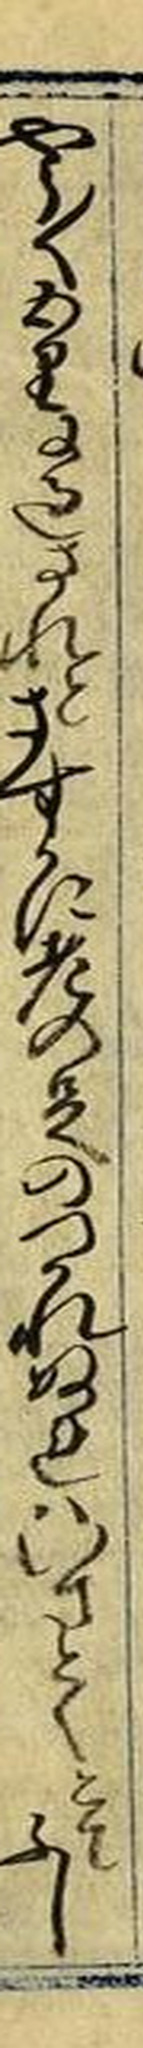やう〳〵五里に過されとさすかに老の足のつかれぬれはいさとくとてふし
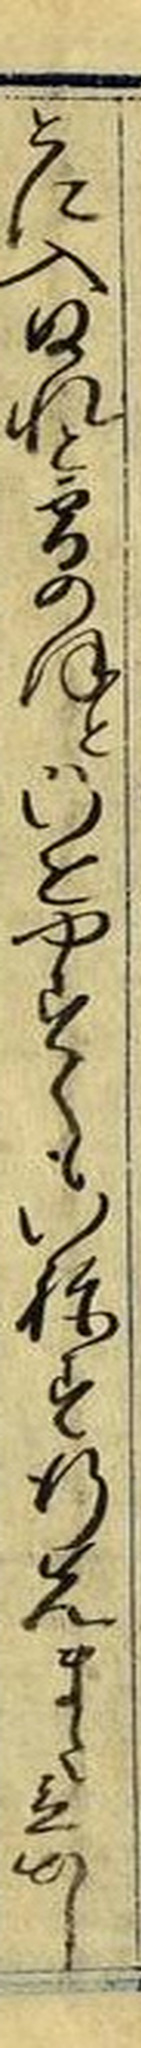とに入ぬれと雪のほとはいとやすくもいねす行先また立出し
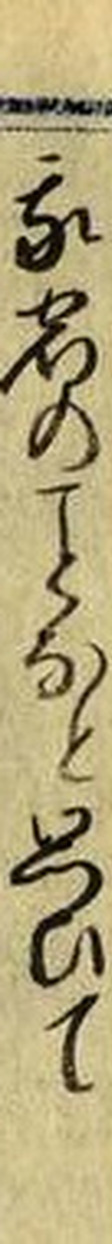我宿のことなと思ひて
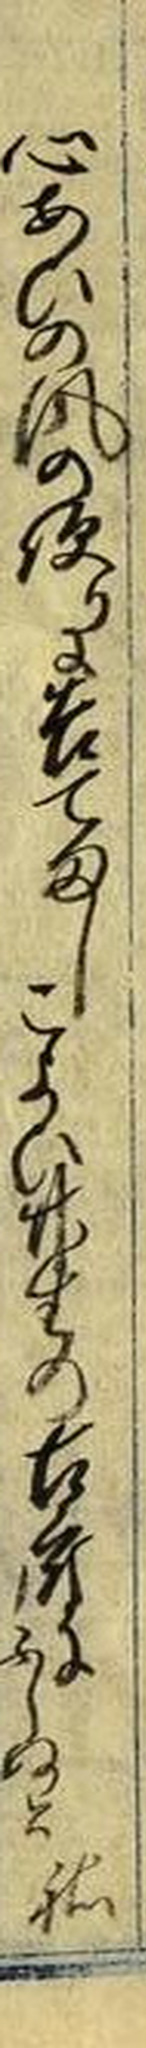心あひの風の便りに告てましこよひ竹生の古府にふしぬと祐
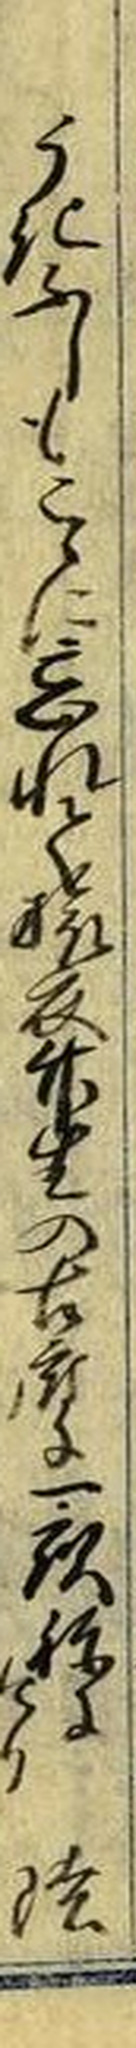うきふしもこゝに忘れて旅衣竹生の古府に一夜ねにけり陸
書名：温古集 三巻
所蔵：福井県文書館 Fukui Prefectural Archives
